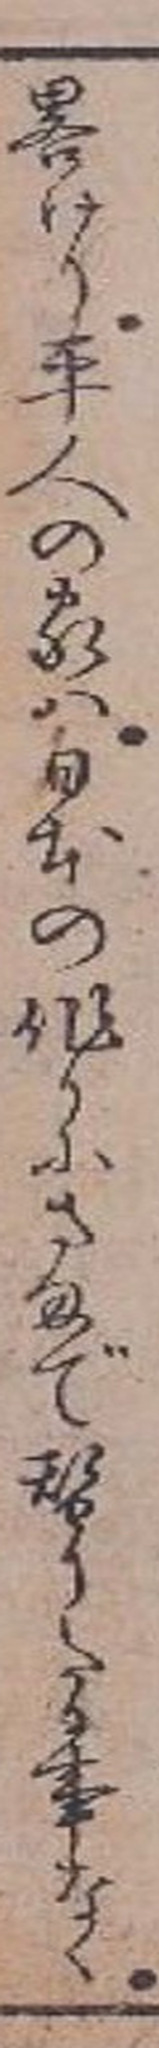略けり、平人の家は、日本の作りにさまで替りたる事なく、

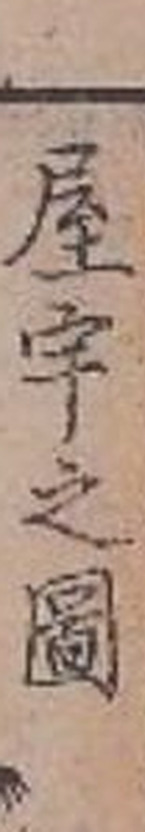屋宇之図

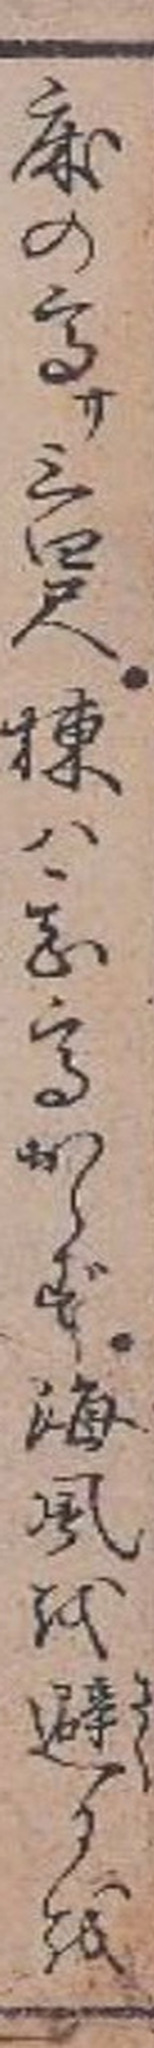床の高三四尺、棟は甚高からず、海風を避るを
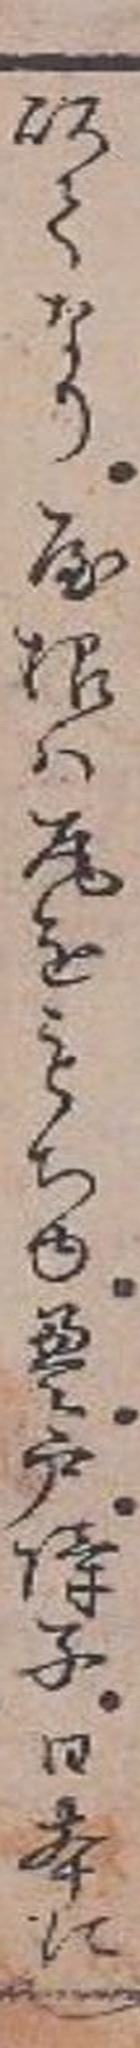以てなり、屋根は瓦をもちゆ、畳、戸、障子、日本に
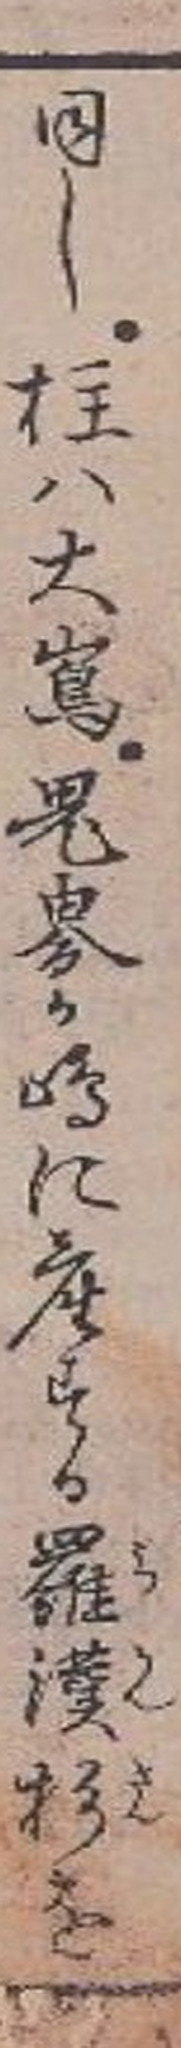同し、柱は大島、鬼界か島に産する羅漢杉を
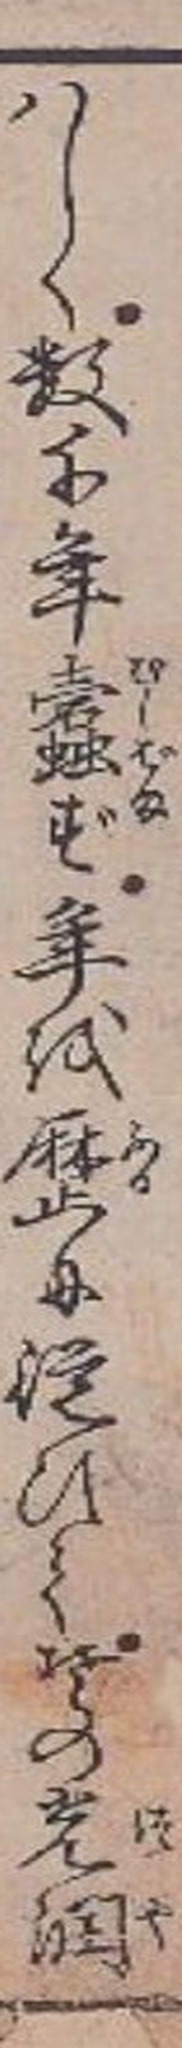はしく、数千年蠧ず、年を歴に従ひて、その光潤
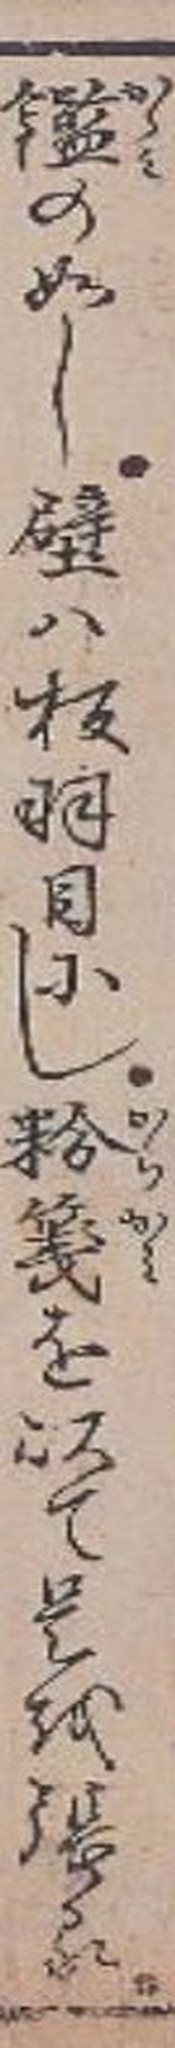鑑の如し、壁は板羽目にし、粉箋を以て是を張る、
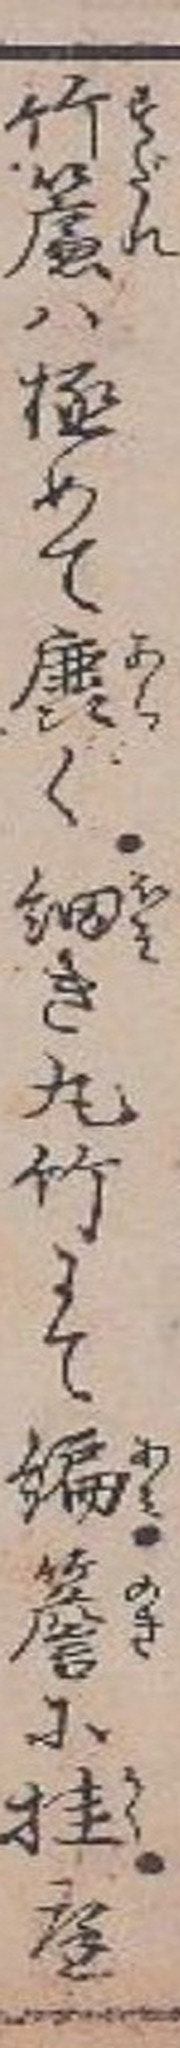竹簾は極めて麁く、細き丸竹にて編、簷に挂、庭
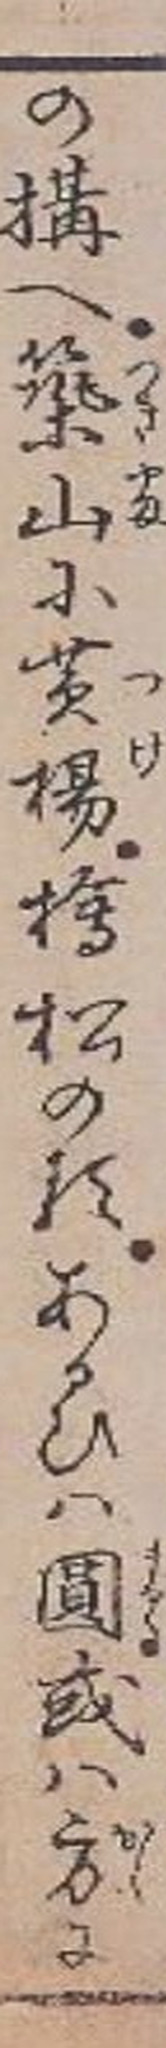の構へ、築山に黄楊、桧松の類、あるひは円、或は方に
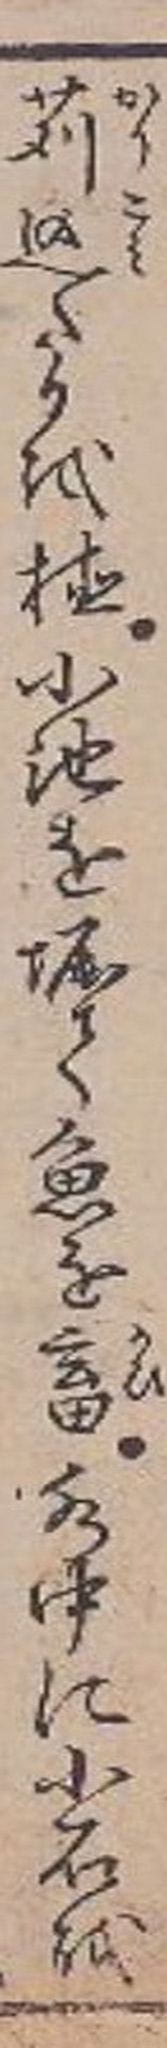苅込たるを植、小池を掘て魚を畜、水中に小石を
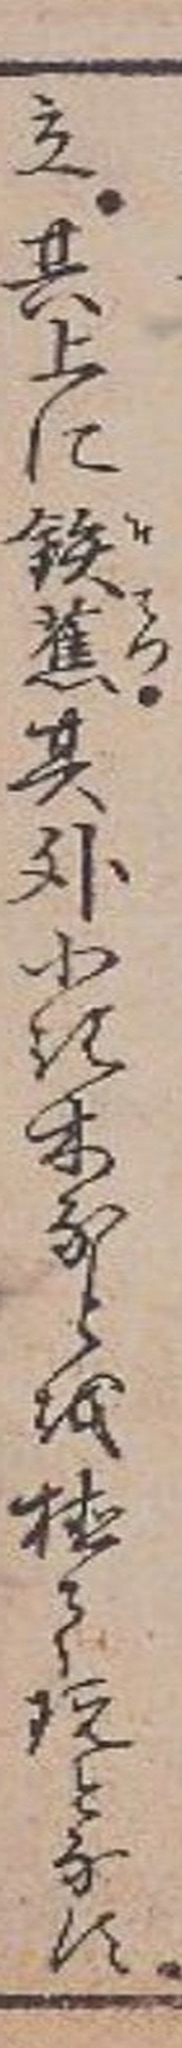立、其上に鉄蕉、其外小紅木なとを植て玩となす、
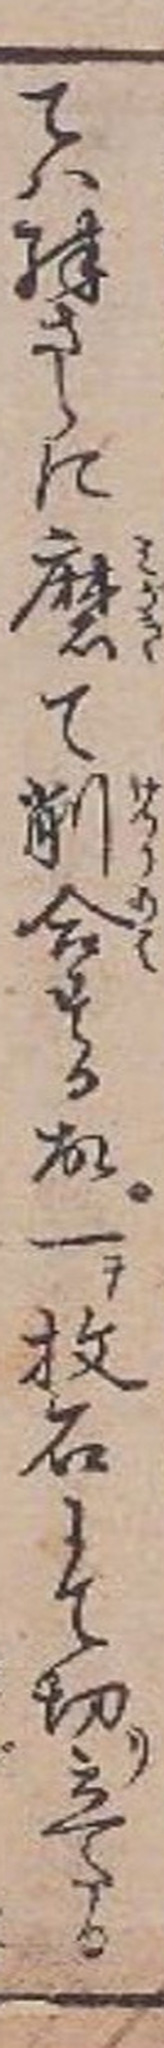ては殊さらに磨て削合する故、一枚石にて切立たる
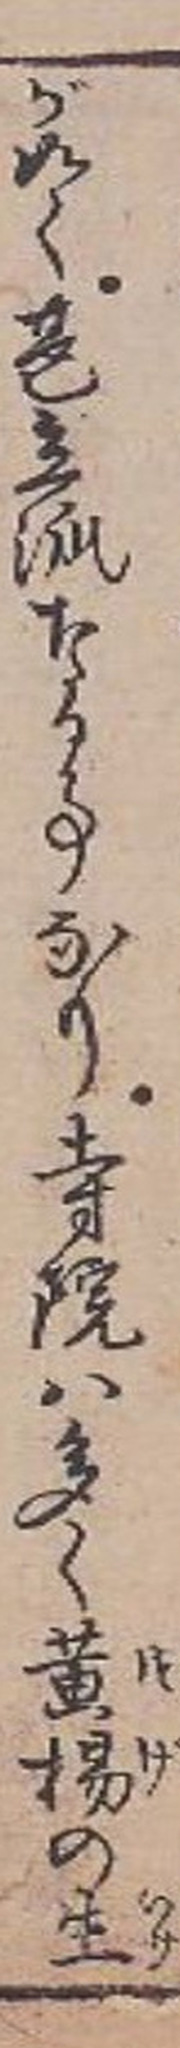が如く、甚立派なる事なり、寺院は多く黄楊の生
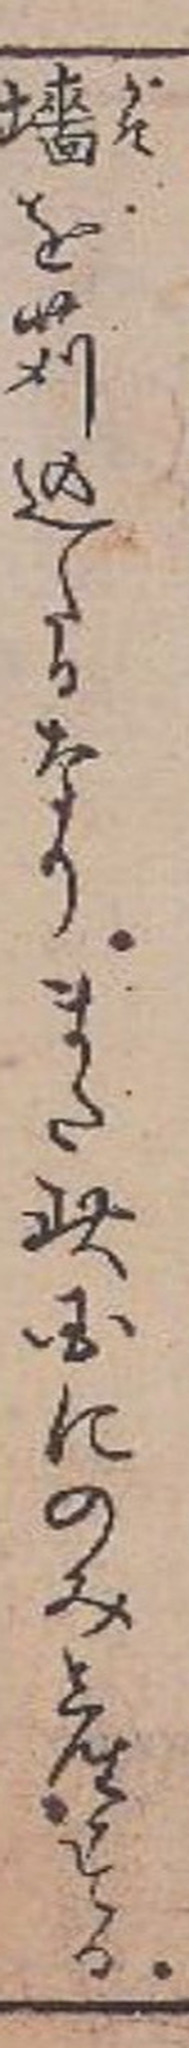墻を苅込たるなり、また此国にのみ産する、
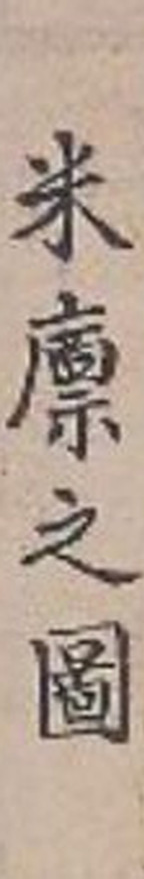米廩之図

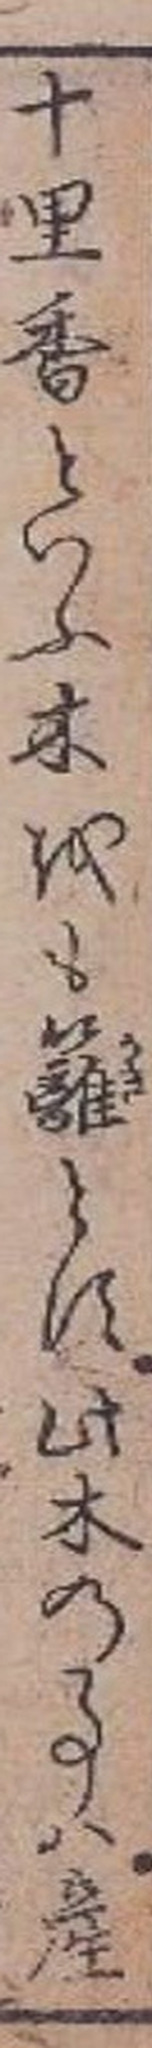十里香といふ木を籬とす、此木の事は、産
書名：琉球談
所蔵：University of the Ryukyus Library
